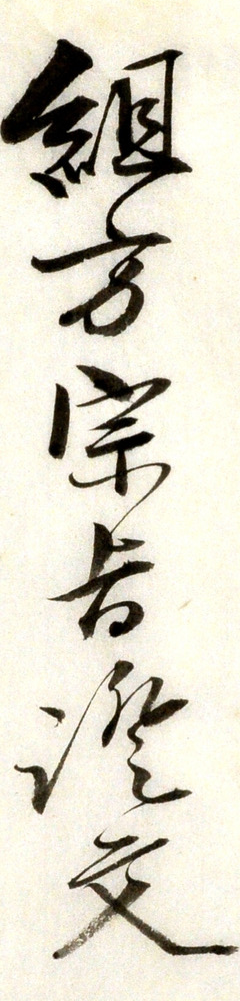組方宗旨証文

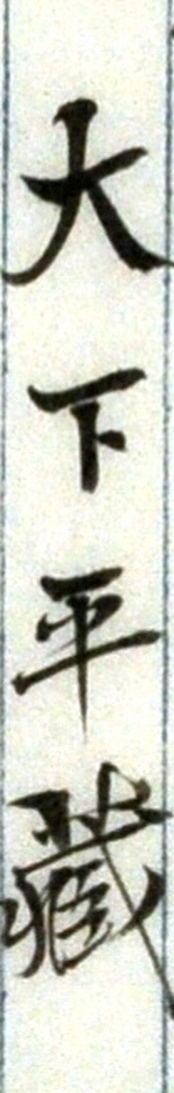大下平蔵
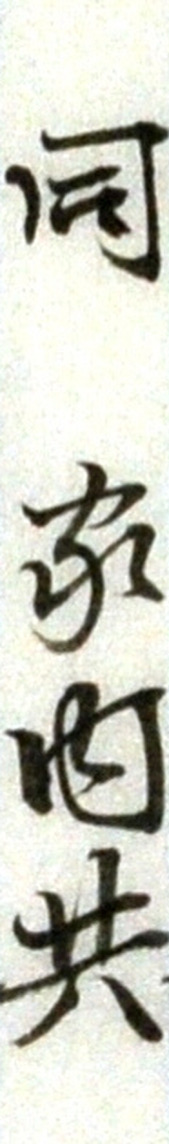同家内共
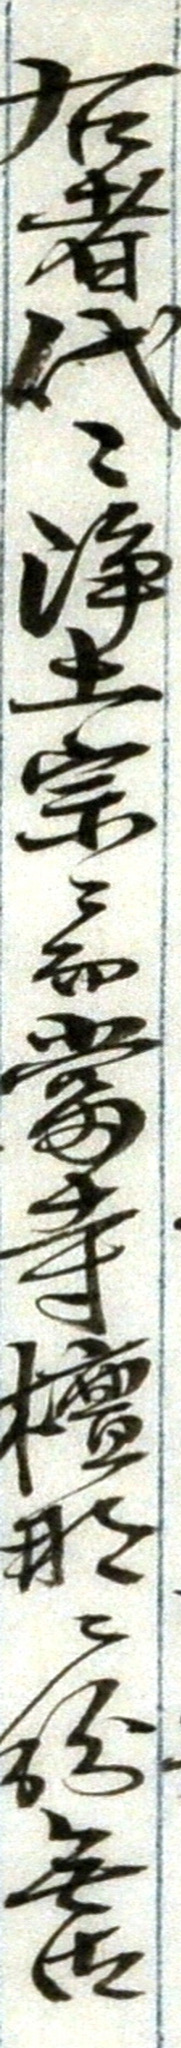右者代々浄土宗ニ而当寺旦那紛無御
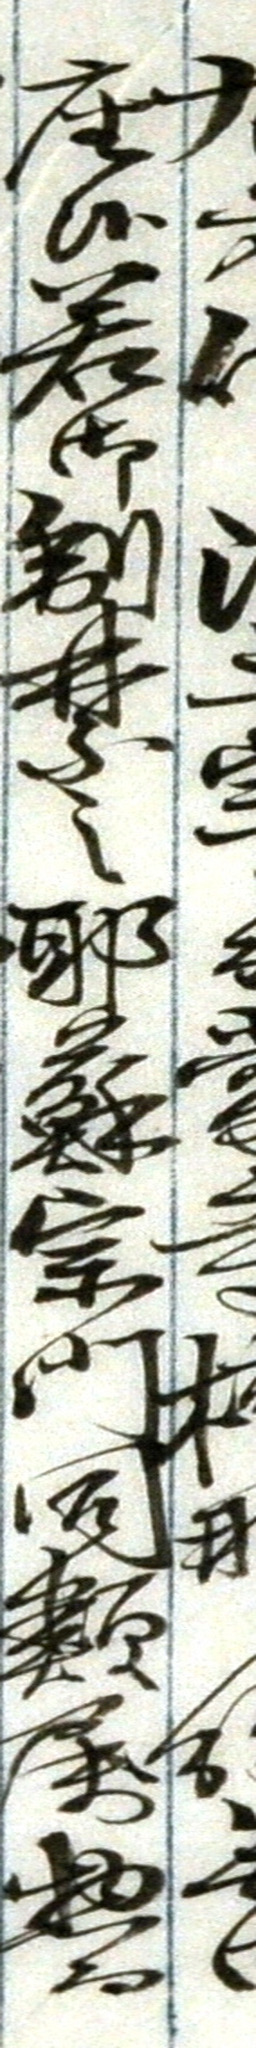座候若御制禁之耶蘇宗門同類属惣而
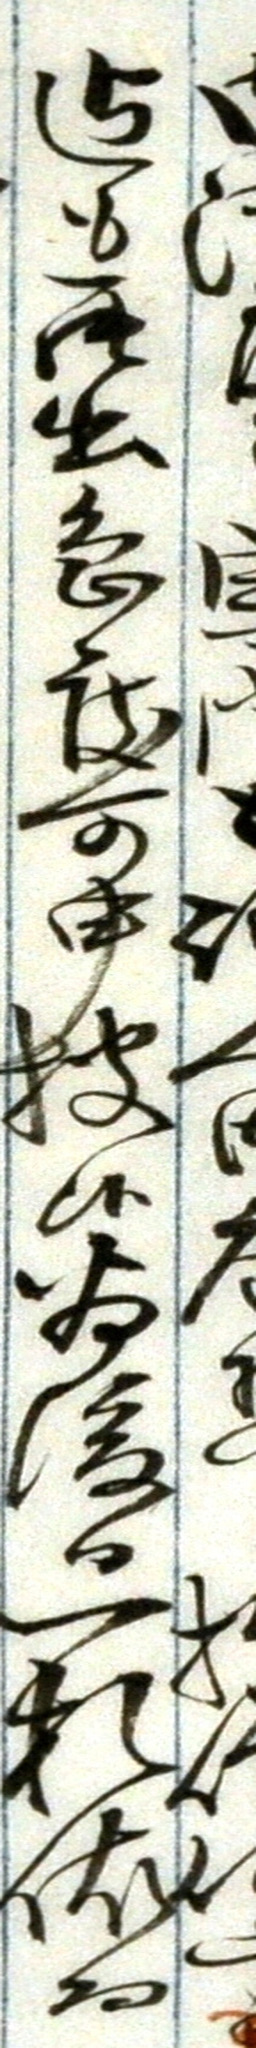迄も罷出急度可申披候為後日一札依而
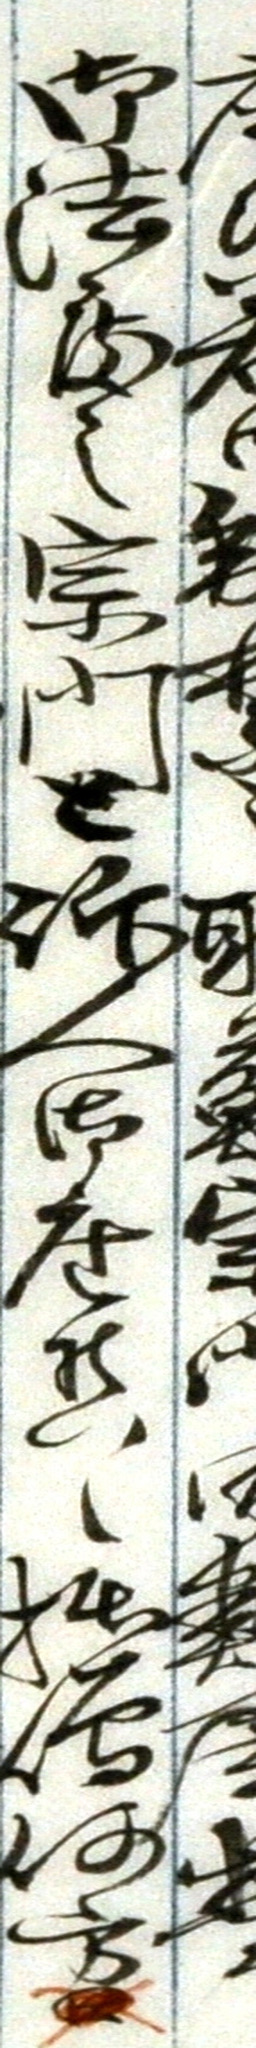御法度之宗門と仰人御座候ハヽ拙僧何方

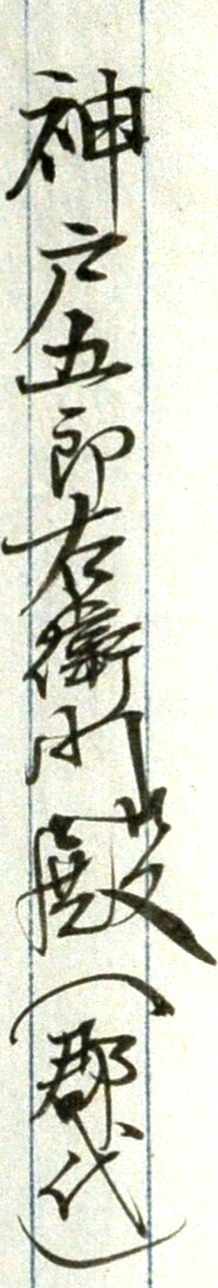神戸五郎右衛門殿郡代
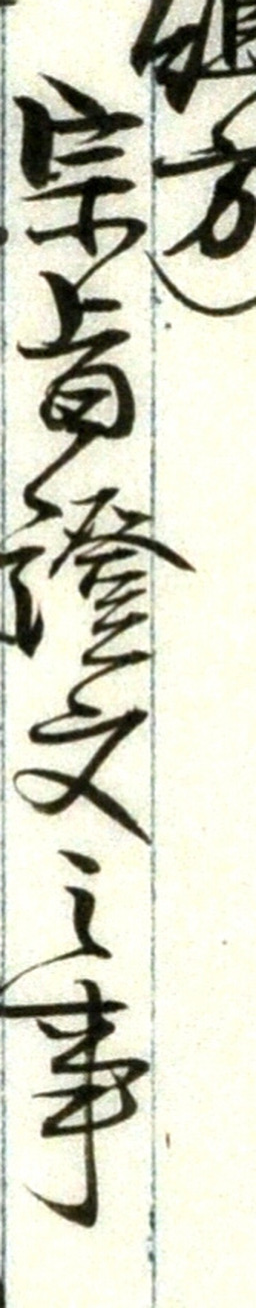宗旨証文之事
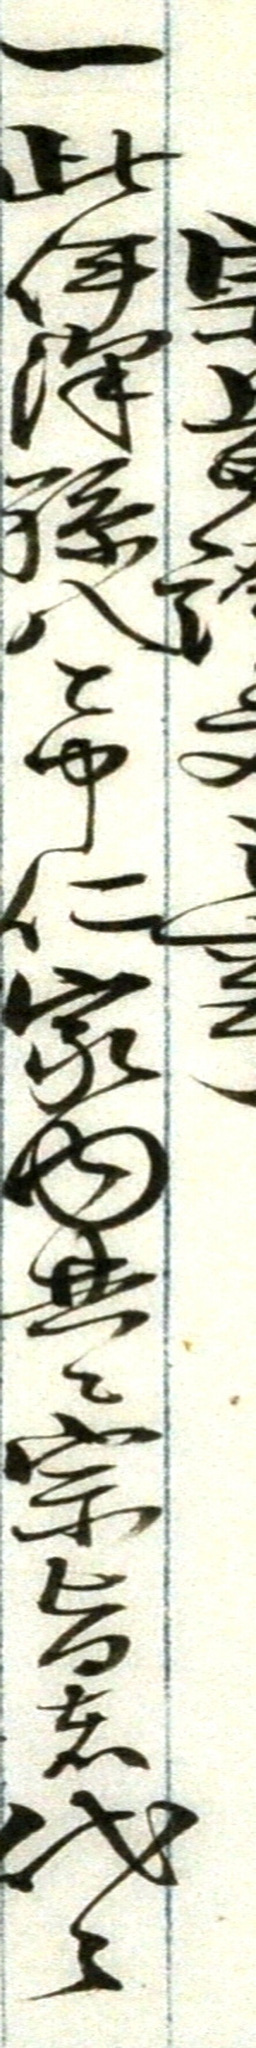一此伊津孫八と申仁家内共と宗旨者代々
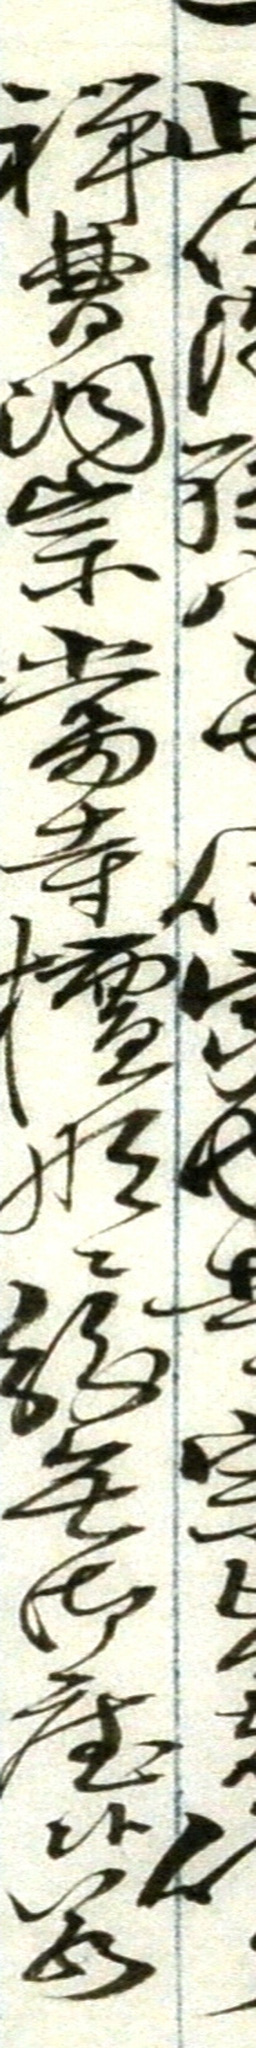禅曹洞宗当寺旦那紛無御座候若
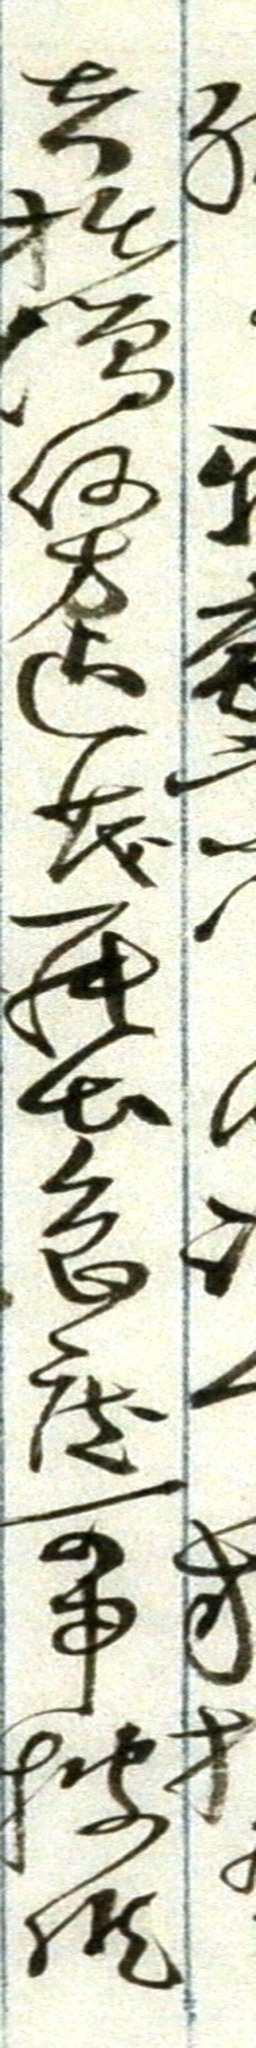者拙僧何方迄茂罷出急度可申披候
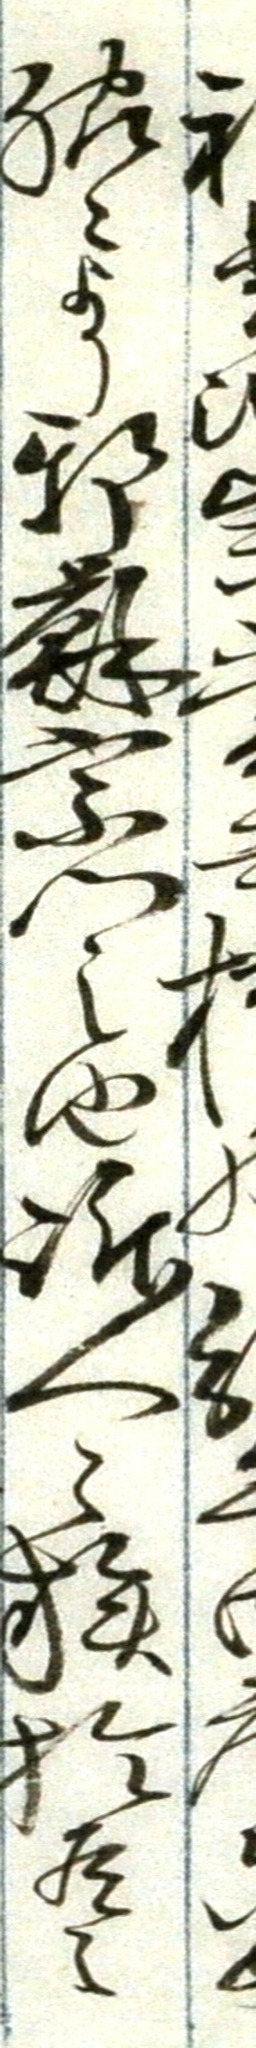脇耶蘇宗門之由訴へ之族於有之
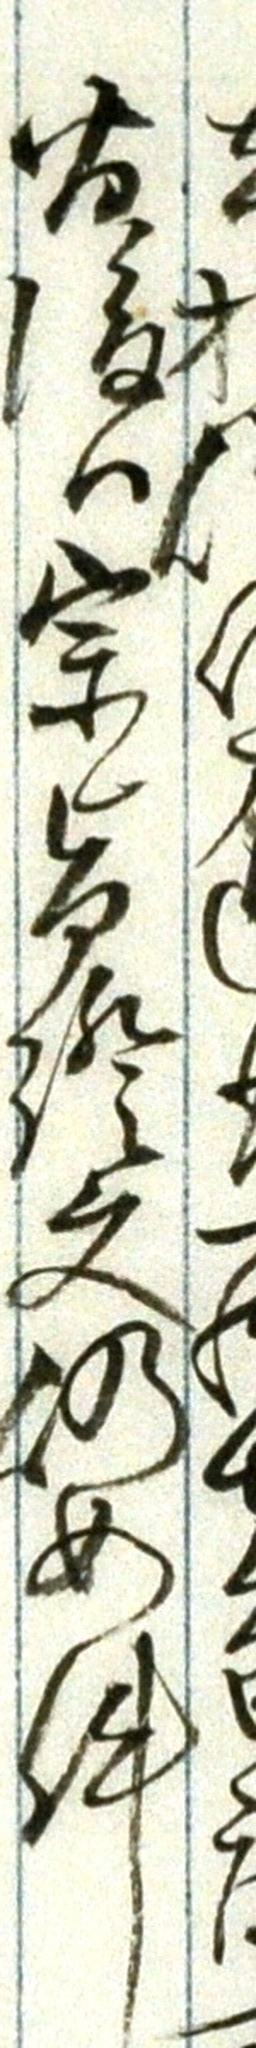為後日宗旨証文仍如件

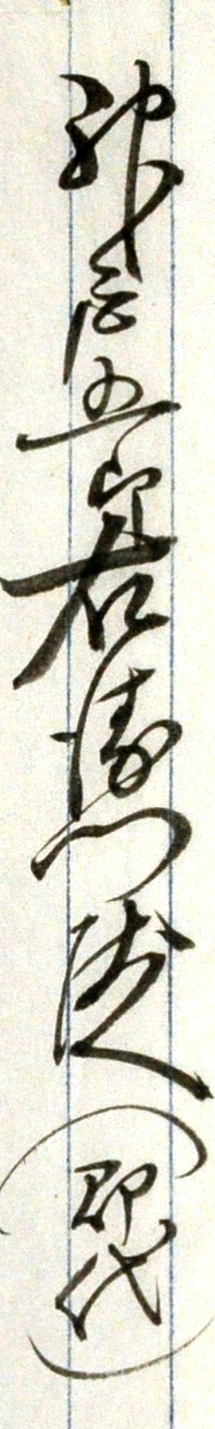神戸五郎右衛門殿郡代
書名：組方宗旨証文（写二通）
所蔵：伊那市立高遠町図書館・合同会社AMANE
